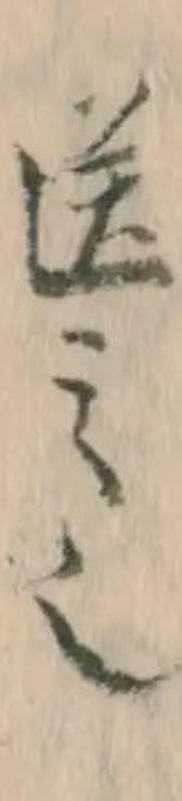送之也
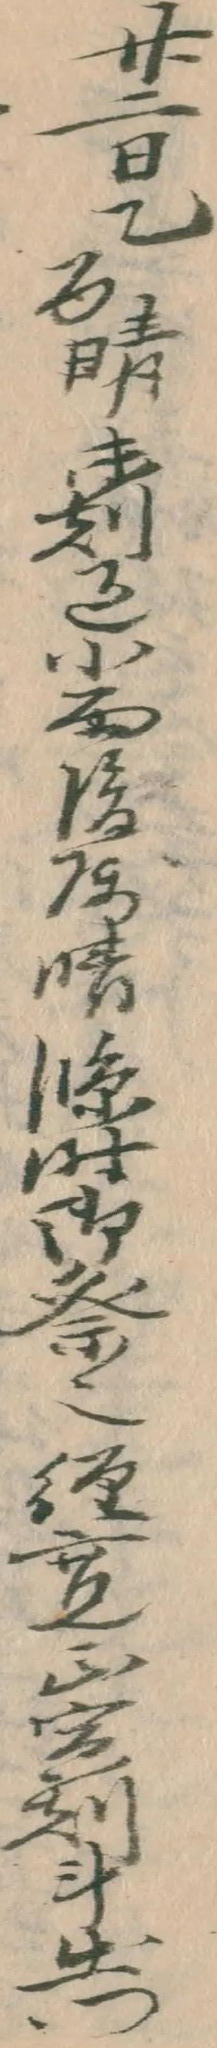廿二日乙酉晴未刻過小雨後属晴臨時御祭也経寛正寅刻斗出門
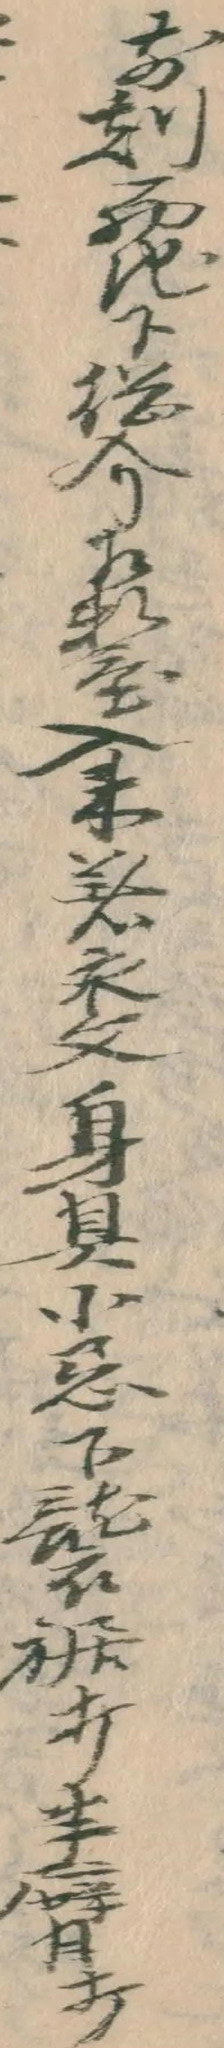前刻西池下総介相頼置入来着衣文身具小忌下襲裾打半臂打
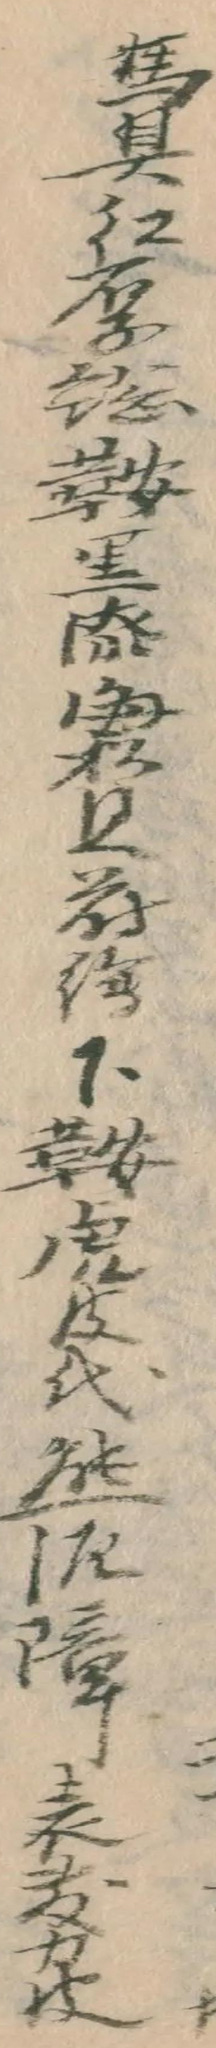馬具紅厚総鞍黒漆海松蒔絵下鞍虎皮代熊泥障表敷力皮

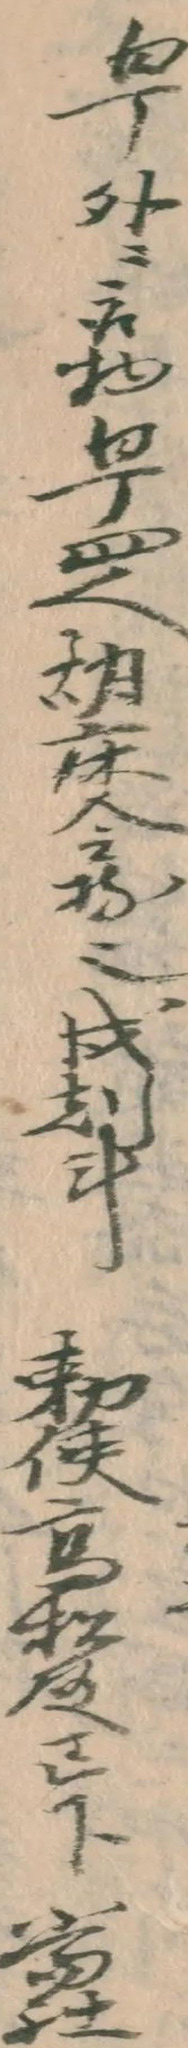白丁外ニ取物白丁四人胡床令持也戌刻斗勅使高松殿已下當社
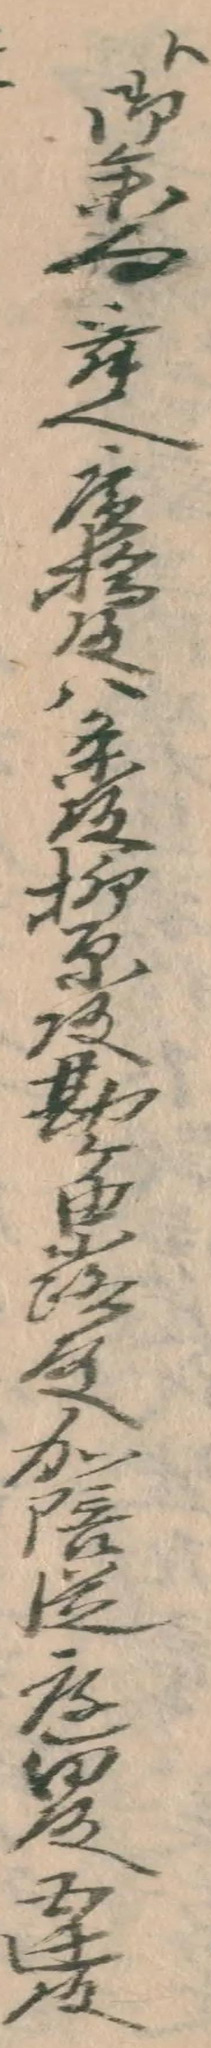え御参向舞人廣橋殿八条殿柳原殿勘ケ由小路殿加陪従庭田殿五辻殿
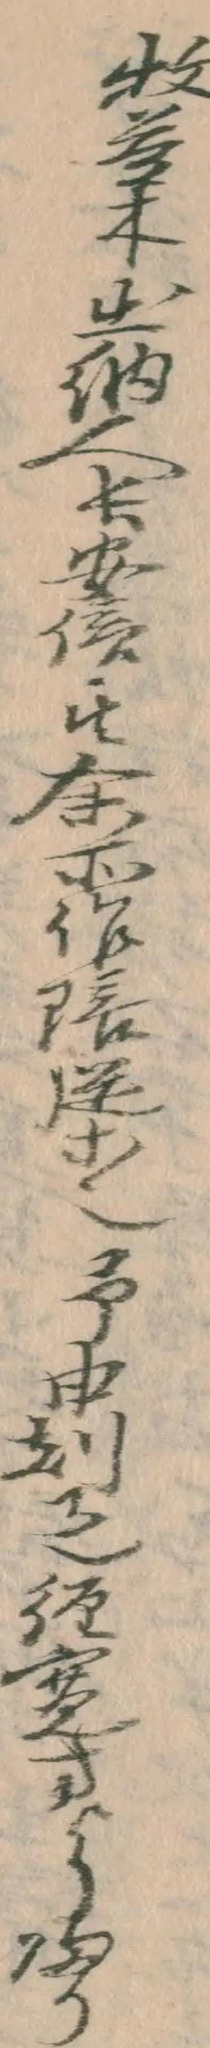牧藤木出納人長安倍其余所作陪従等也予申刻過経寛方より帰り
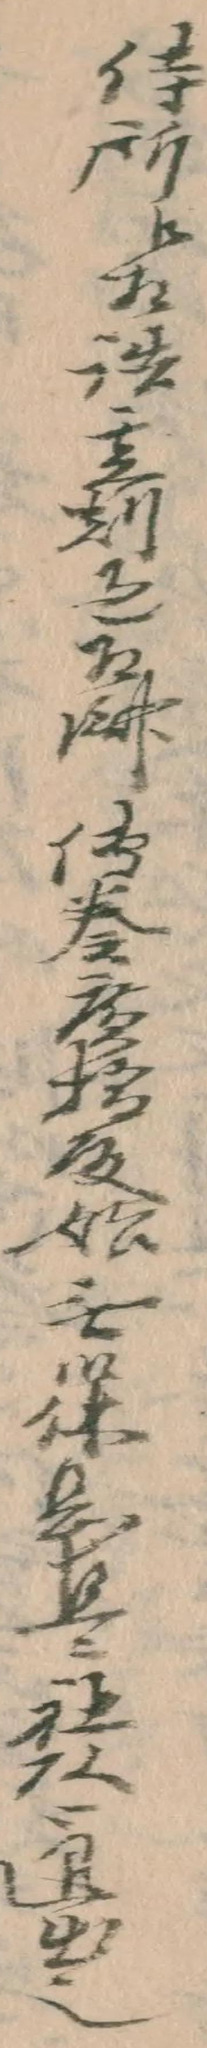侍所え相詰亥刻過相済傳奏廣橋殿始無御休息直ニ社頭御退出也
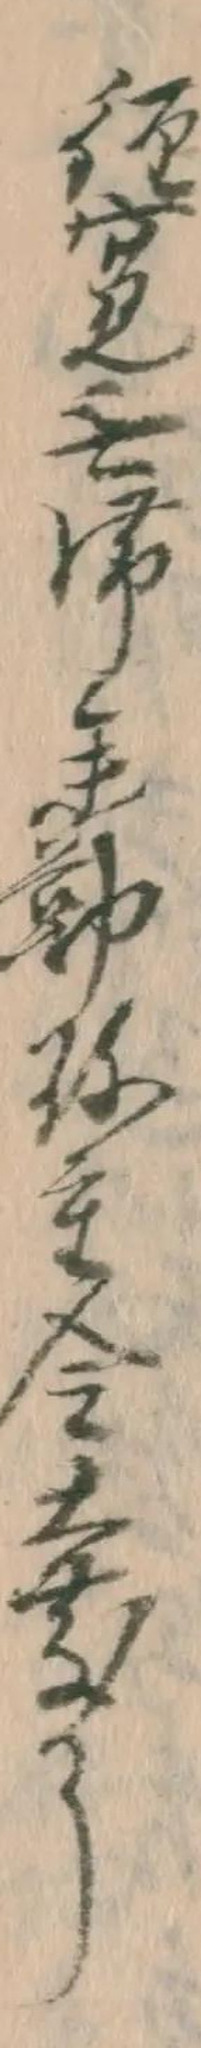経寛無滞参勤珍重令大處了
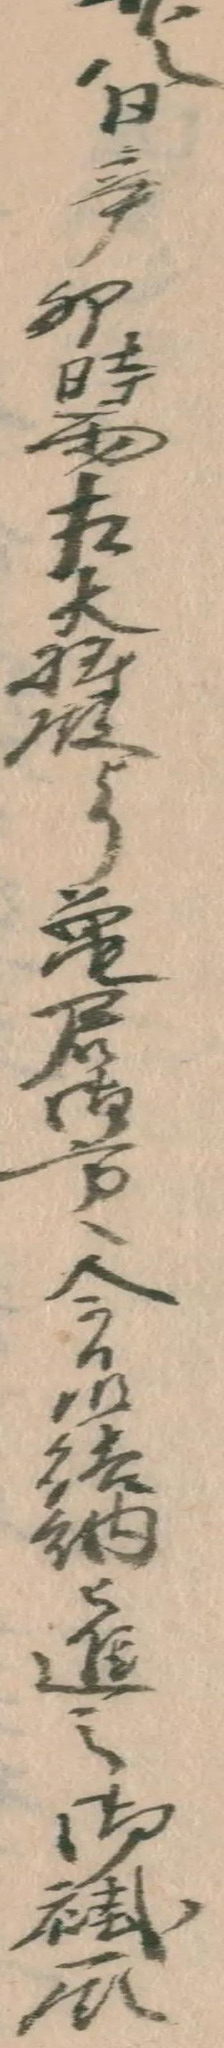廿八日辛卯時雨左大将殿より亀君御方へ今日御結納被進之御褂一領
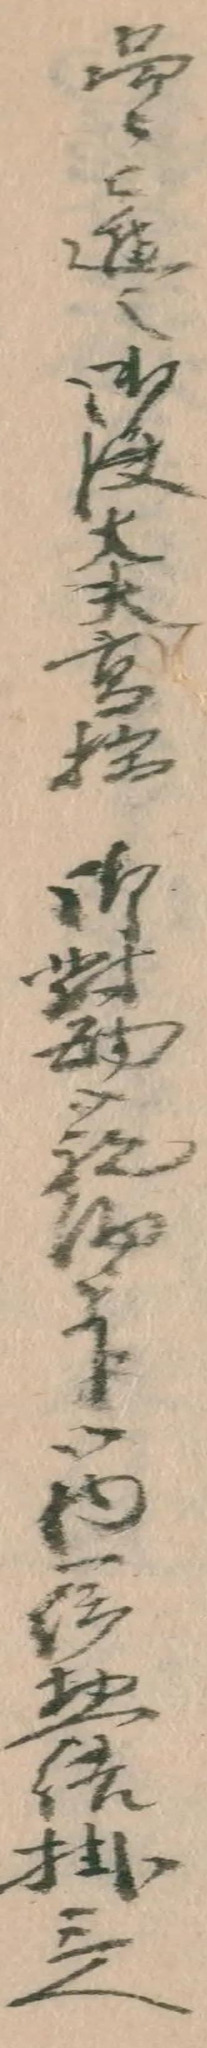品々被遊之御使大夫高橋御對面御祝物已下御内一統惣詰掛三人
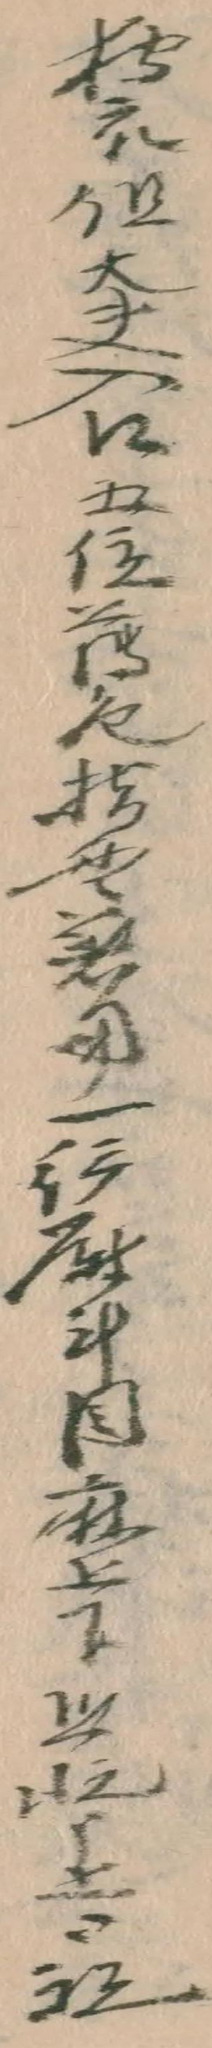披衣但大夫入江五位薄色指貫着用一統熨斗目麻上下恐悦申上御祝
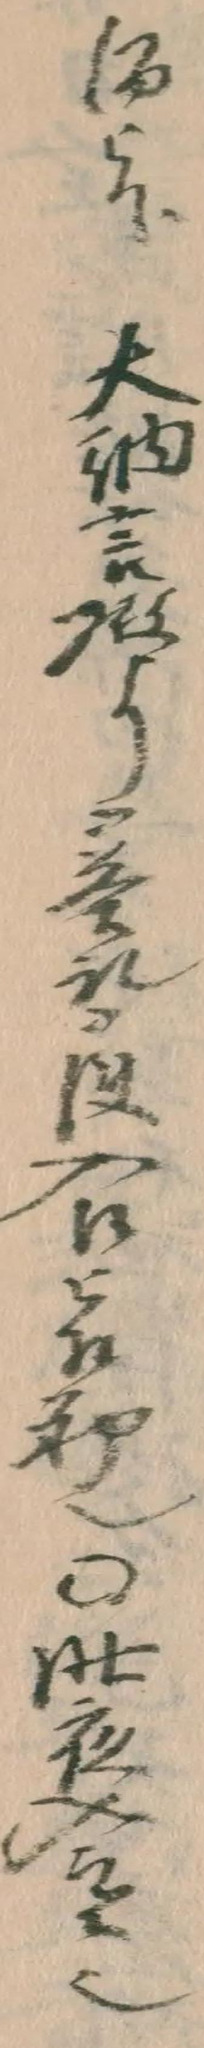酒被下大納言殿より御答礼御使入江被相勤也○昨夜入也
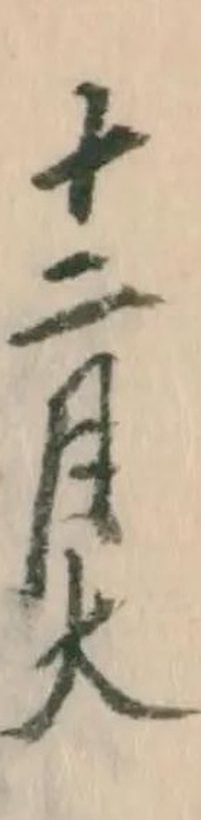十二月大
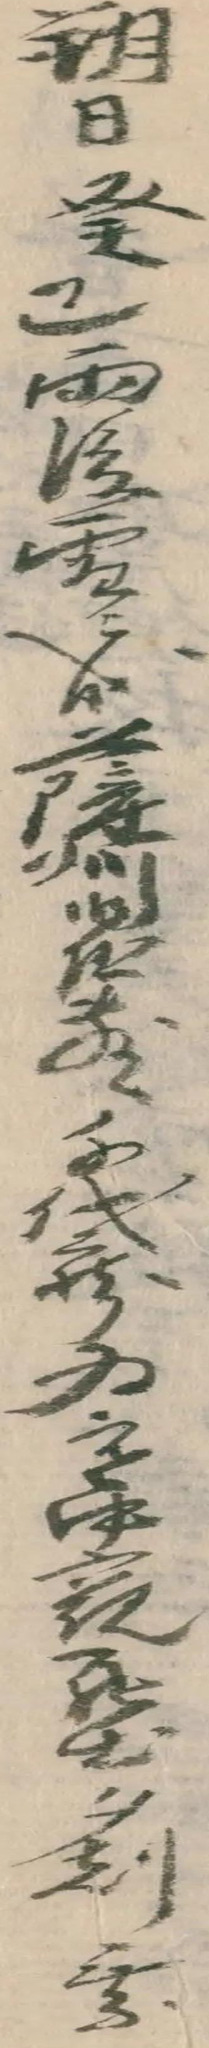朔日癸巳雨後雪ニ成薩州御屋敷へ千代蔵為遠中窺罷出タ刻乗
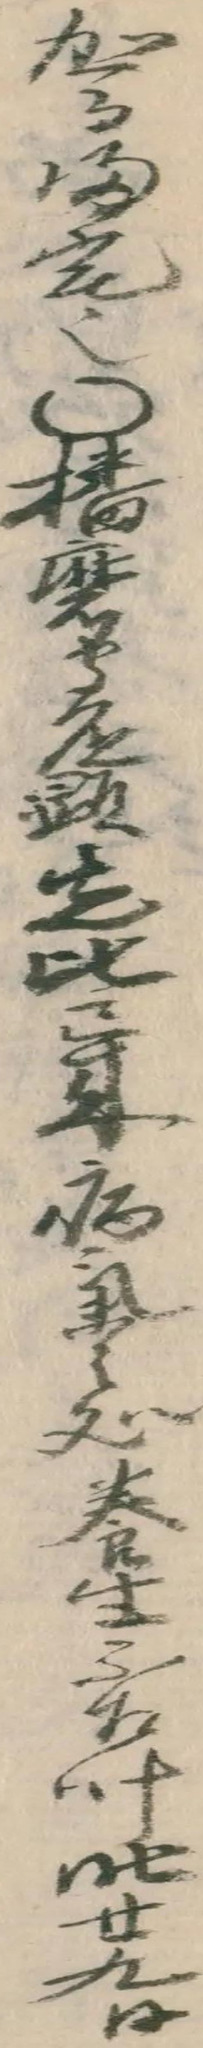駕帰宅也○播磨守丕顕先比已来病氣之処養生不相叶昨廿九日
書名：賀茂社記録. 第69冊
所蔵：国立国会図書館 National Diet Library, JAPAN
